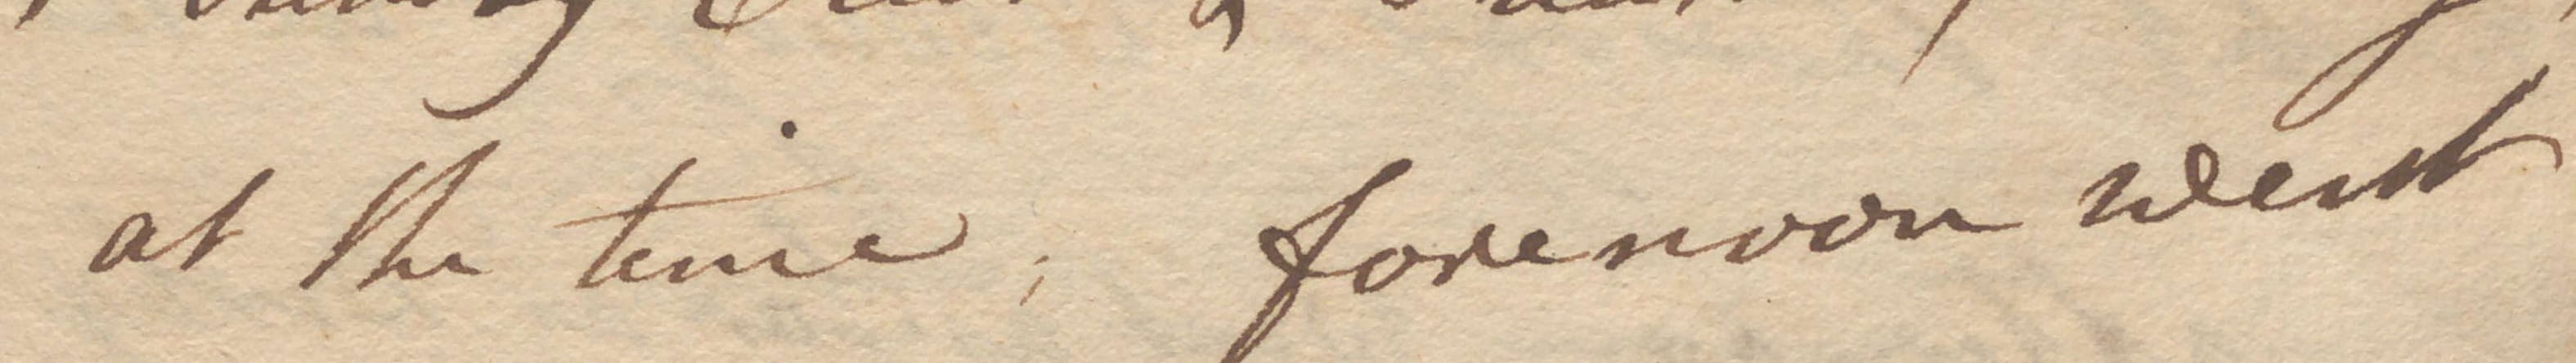at the time, forenoon went
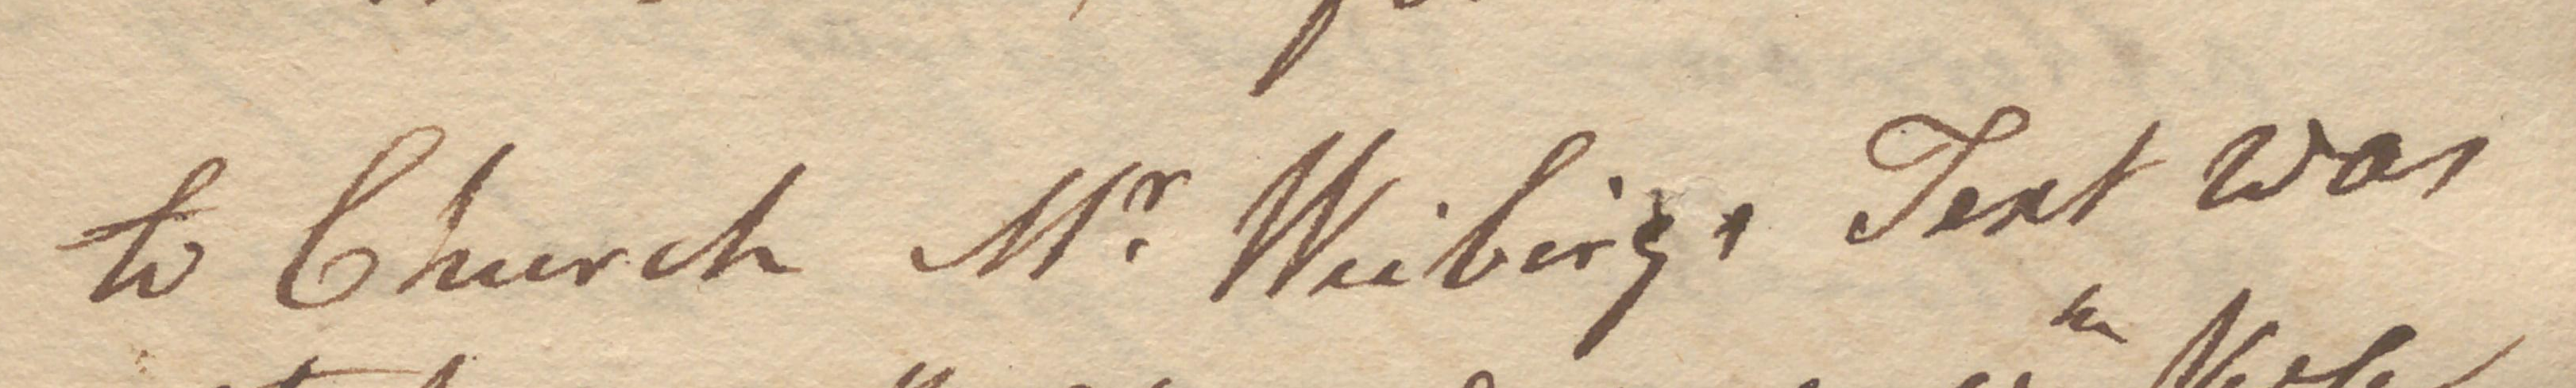to Church M^r. Weibergs Text was
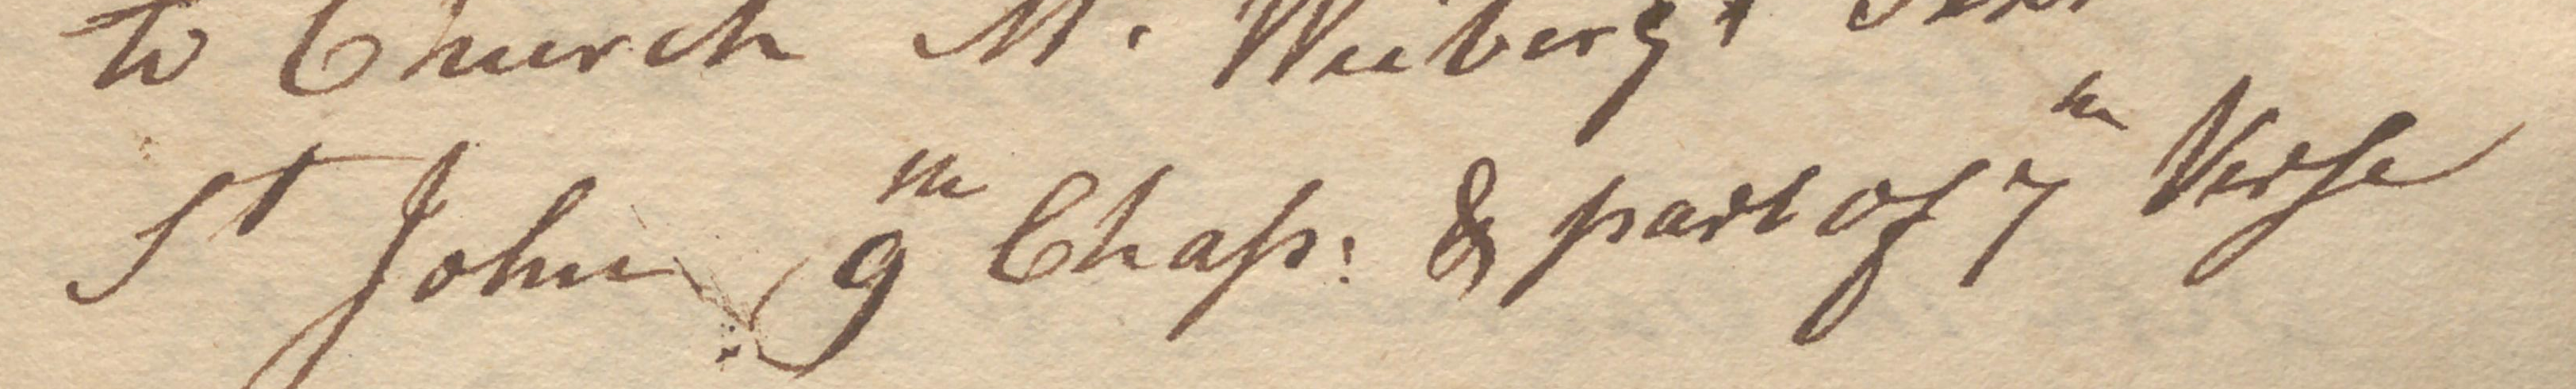S^t John 9^th Chap: & part of 7^th Verse
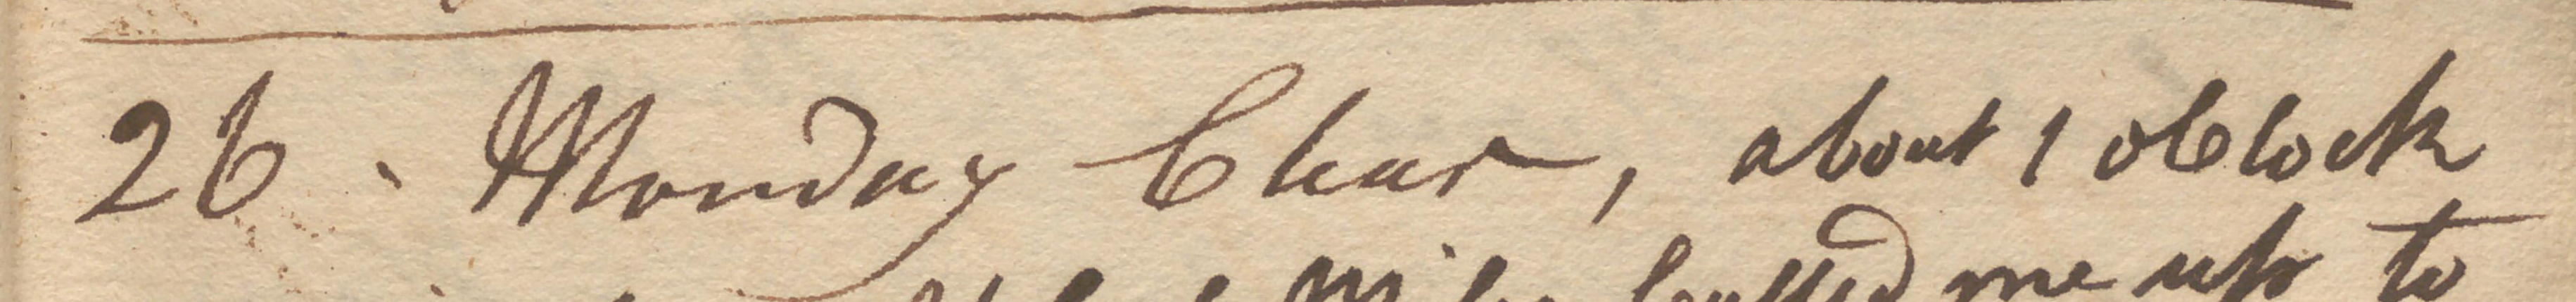26. Monday Clear, about 1 oClock
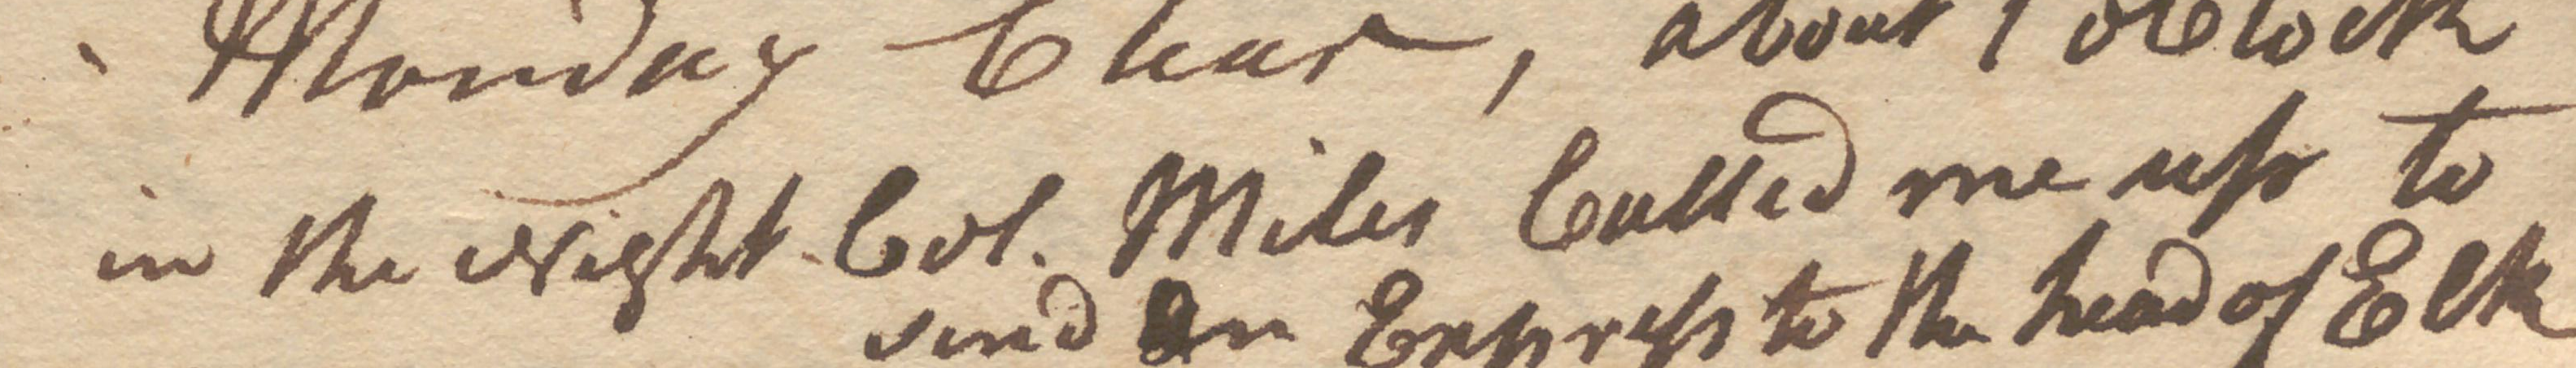in the Night Col. Miles Called me up to
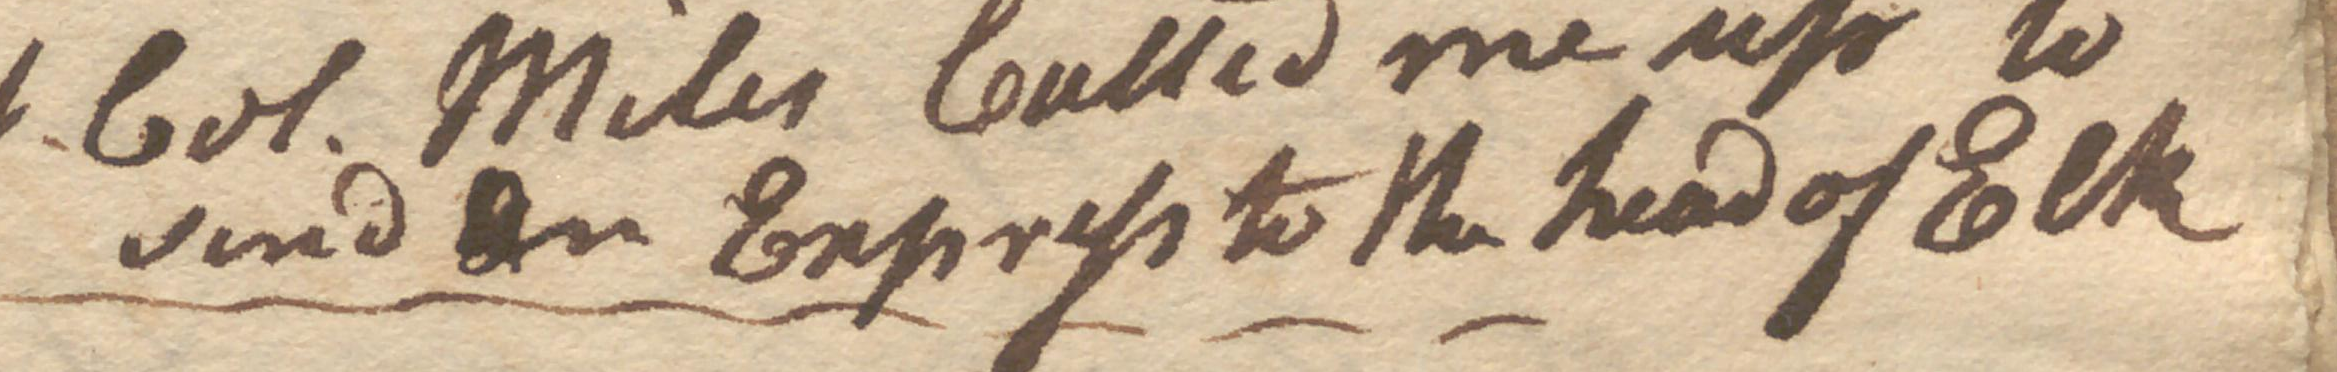send an Express to the head of Elk
